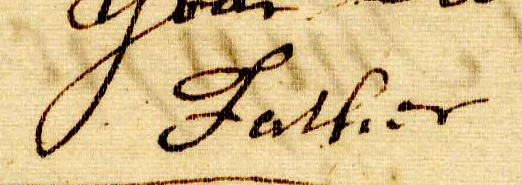Father
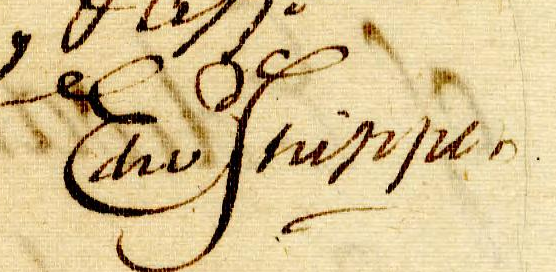Edw^d. Shippen
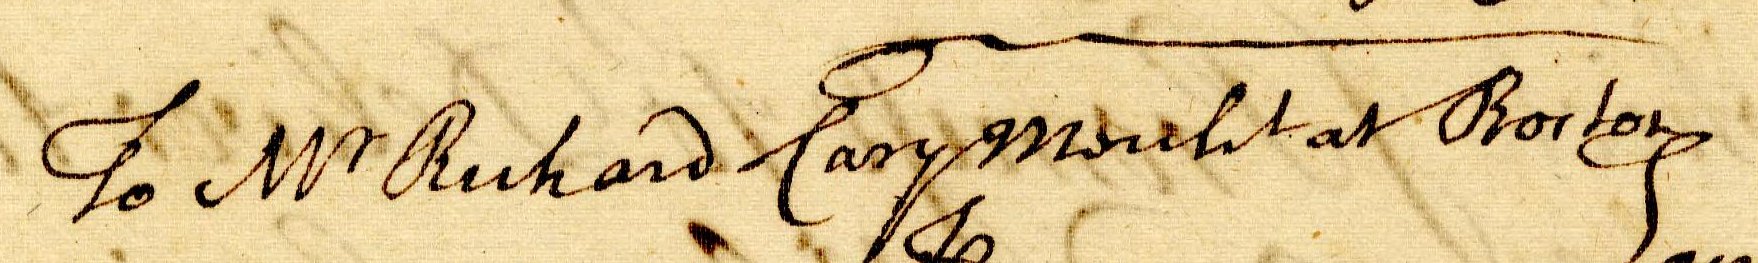To M^r Richard Cary Mercht at Boston
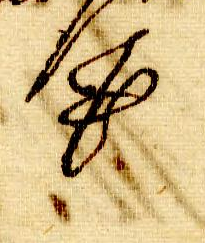per
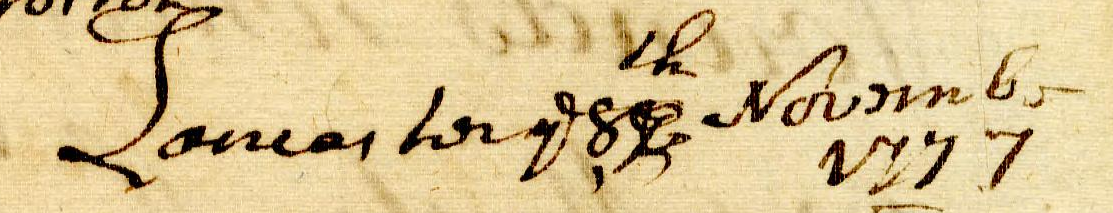Lancaster y^e 8^th. Novemb-
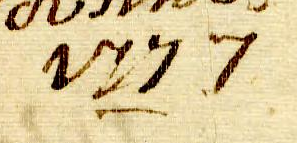1777
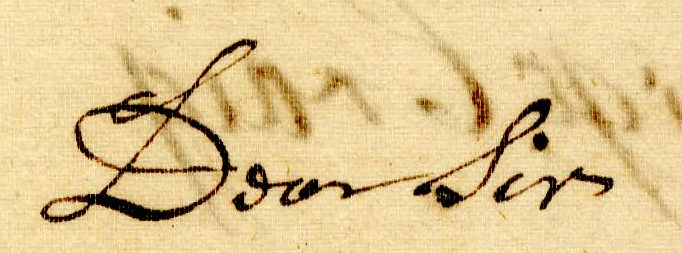Dear Sir
